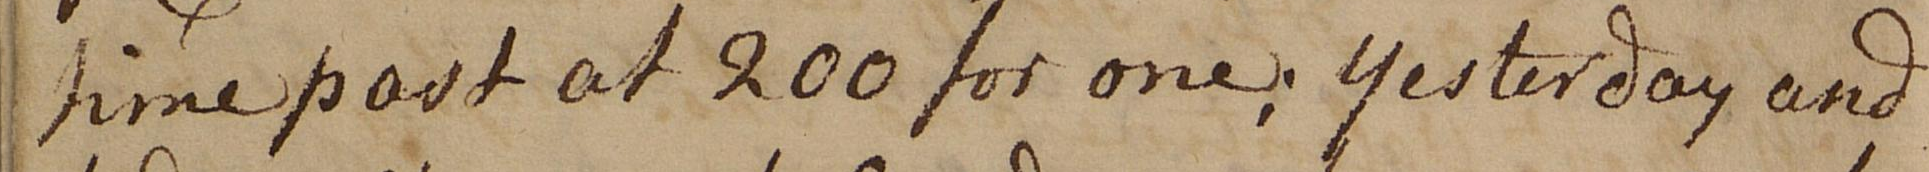time past at 200 for one; Yesterday and
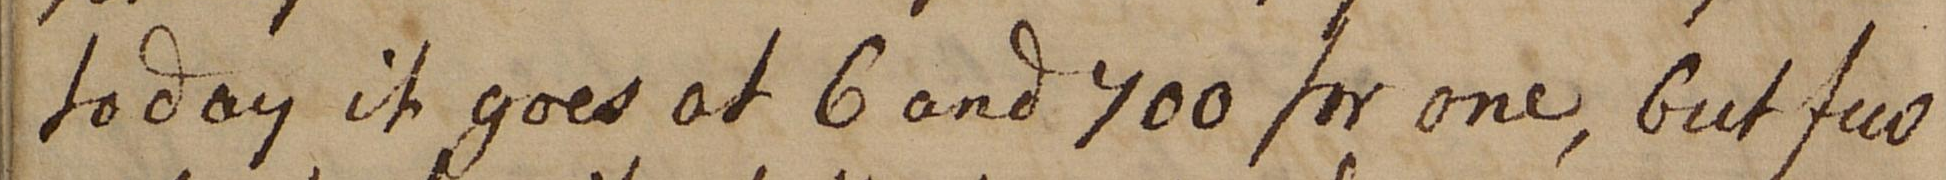today it goes at 6 and 700 for one, but few
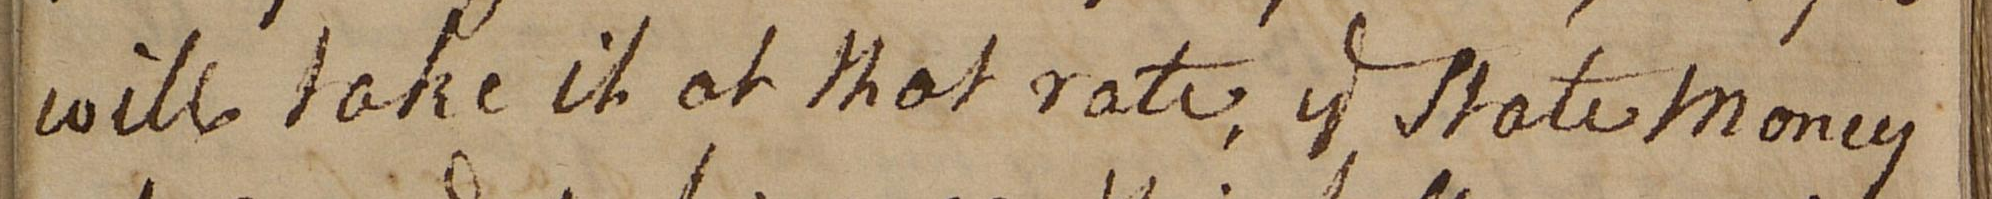will take it at that rate, y^e State Money
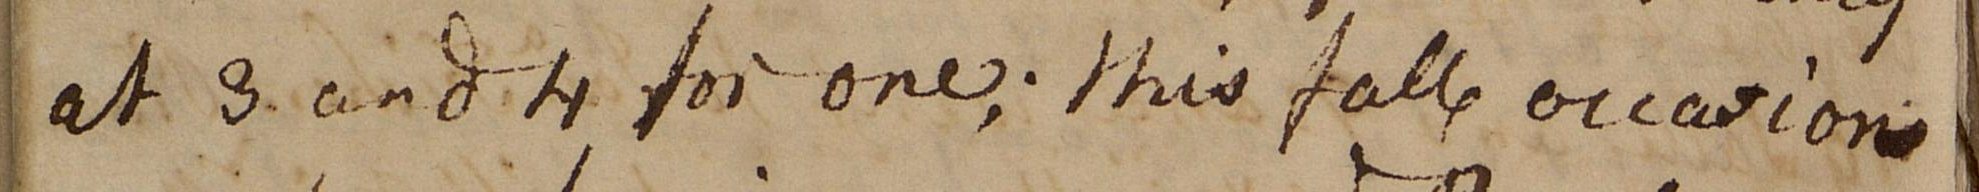at 3 and 4 for one, this fall occasions
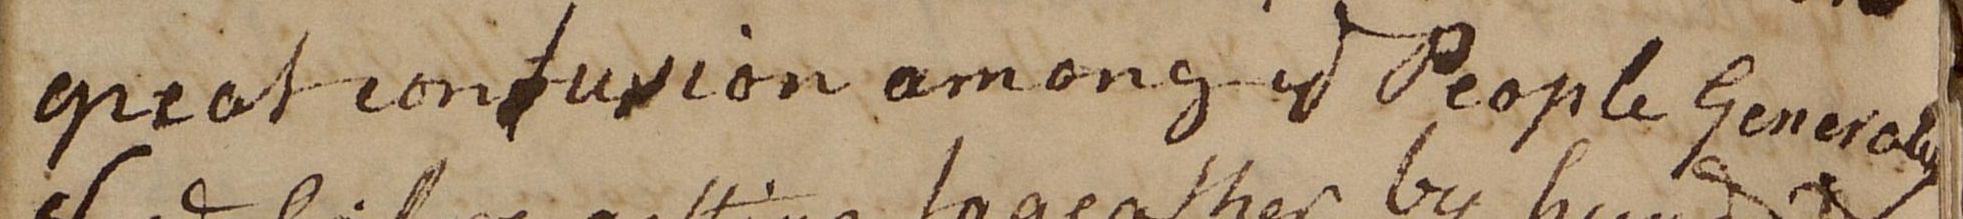great confusion among y^e People Generaly
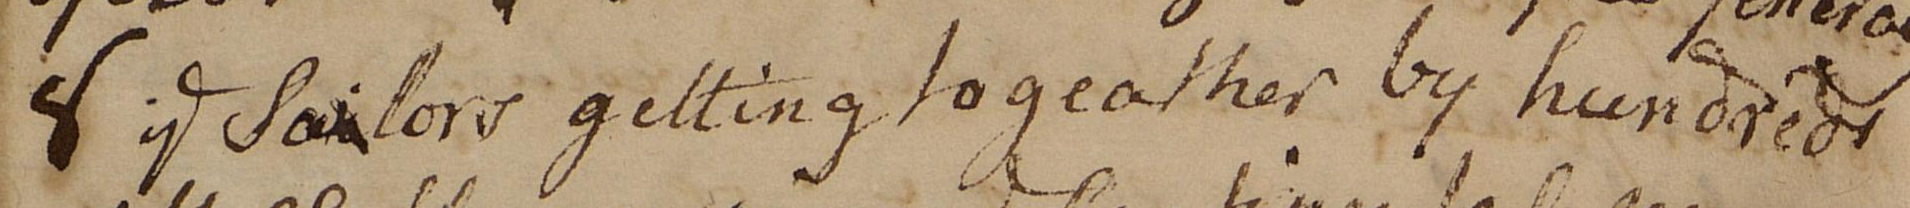8 y^e Sailors getting togeather by hundreds
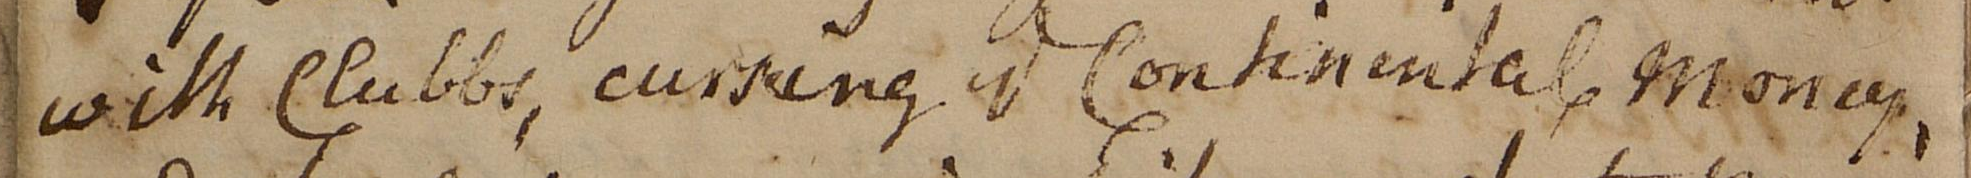with Clubbs, cursing y^e Continental Money,
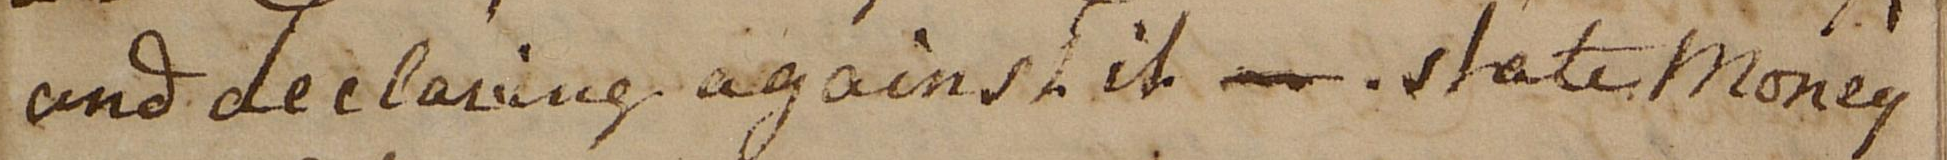and declaring against it- state Money
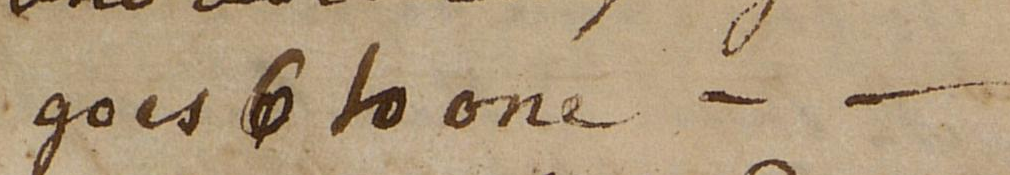goes 6 to one--
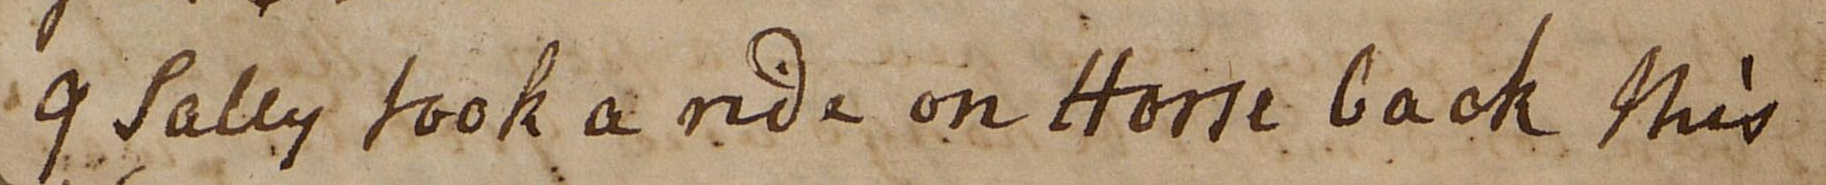9 Sally took a ride on Horse back this
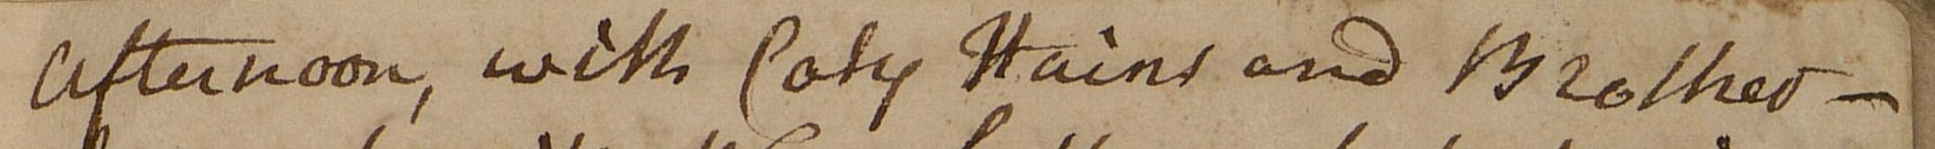Afternoon, with Caty Hains and Brother-
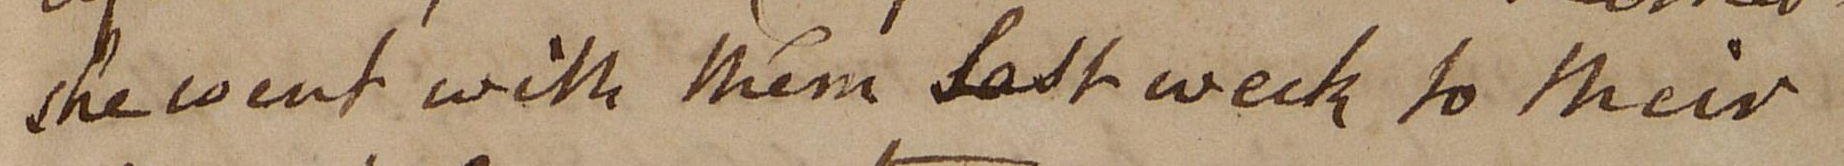the went with them Last week to their
